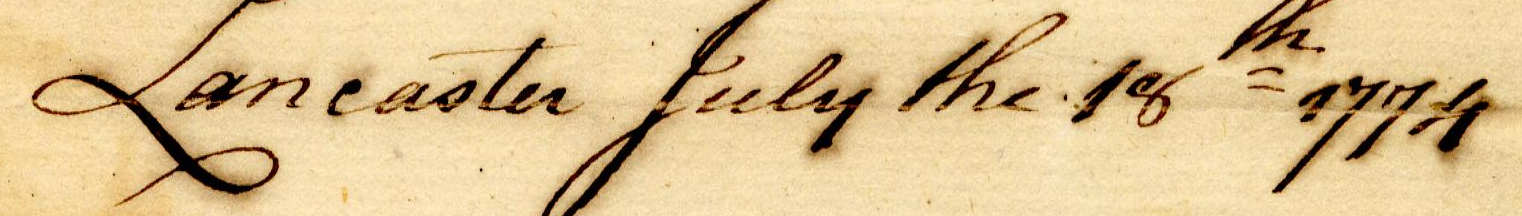Lancaster July the 18^th 1774
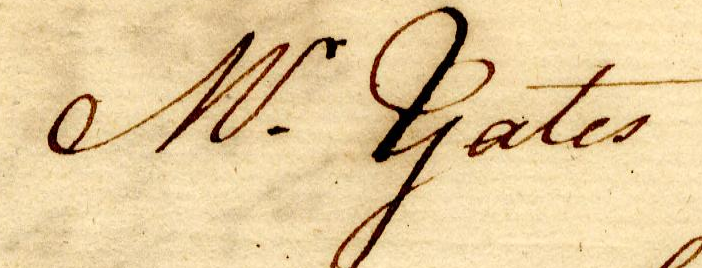M^r Yates
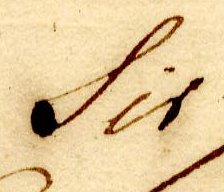Sir
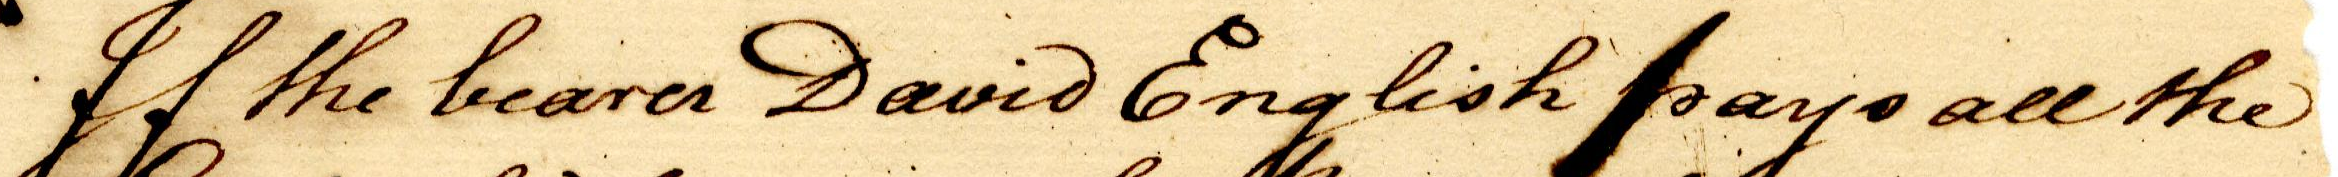If the bearer David English pays all the
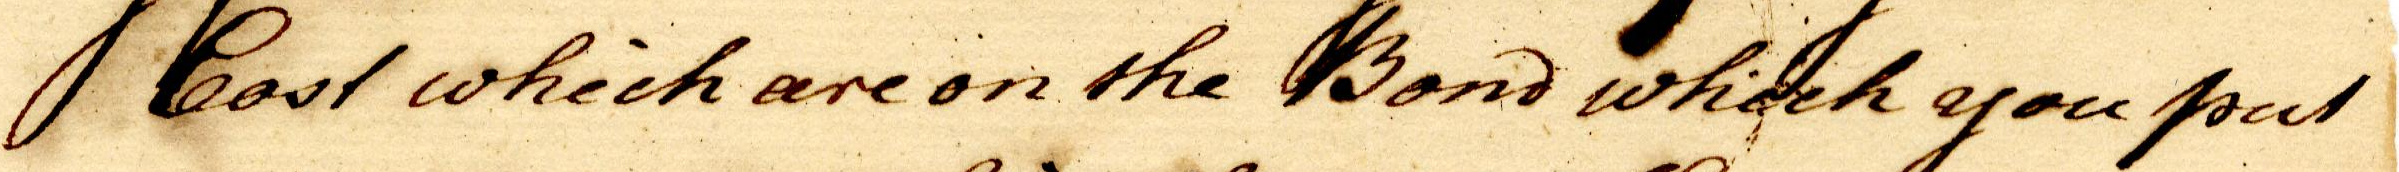Cost which are on the Bond which you put
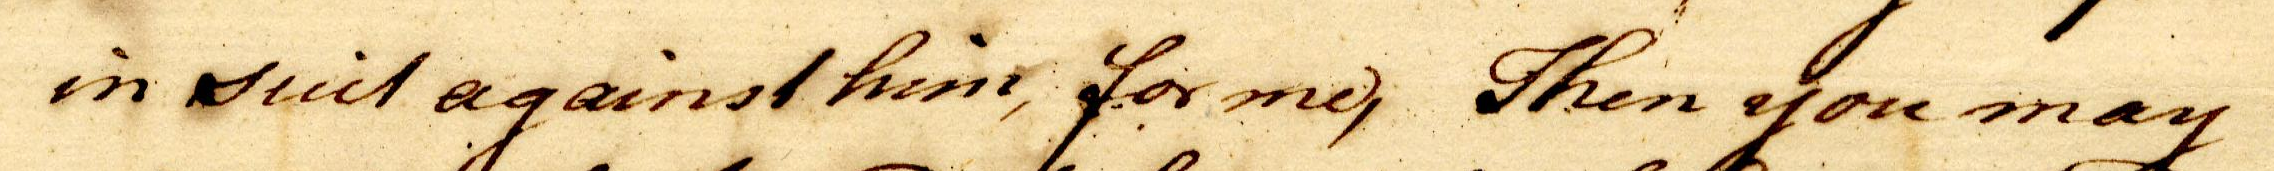in suit against him, for me, Then you may
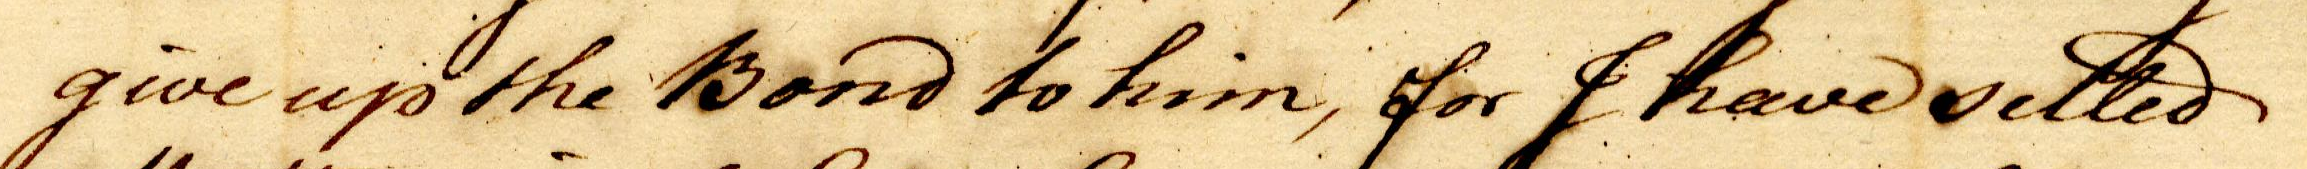give up the Bond to him, for I have setled
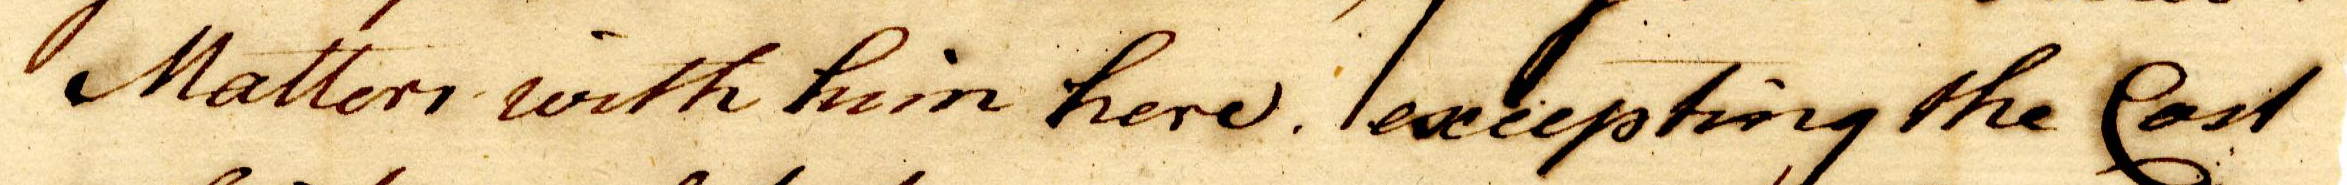Matters with him here, excepting the Cost
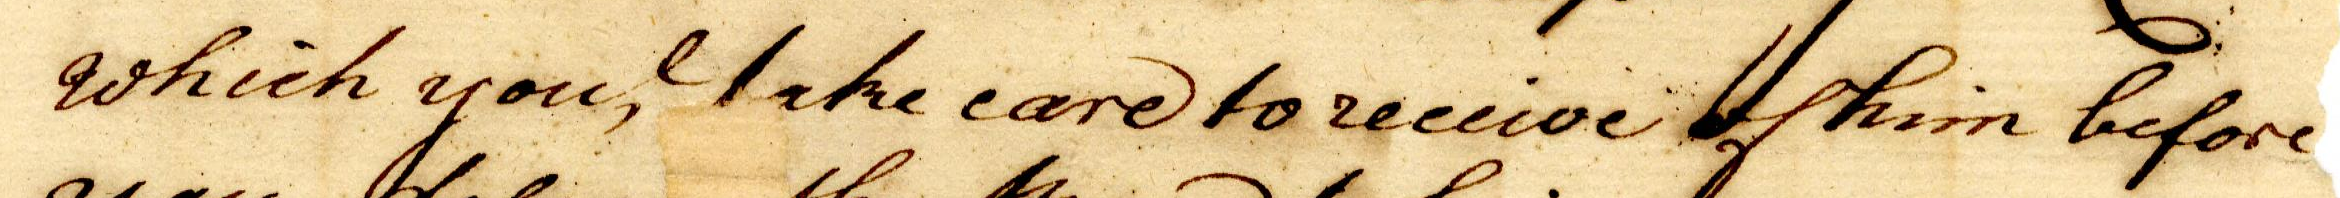which you^l, take care to receive of him before
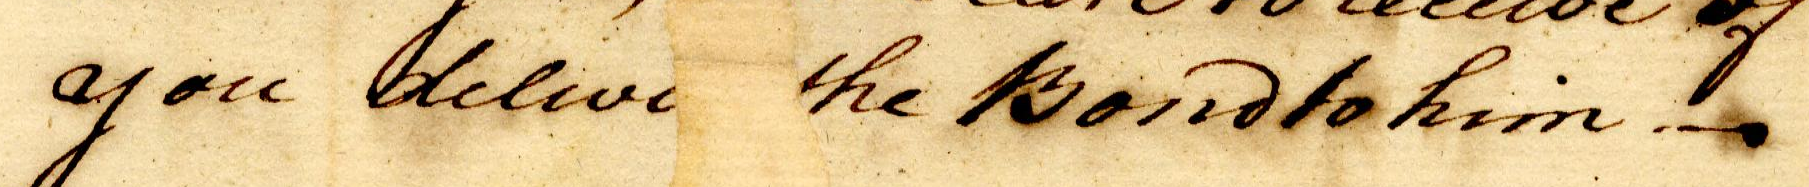you deliver the Bond to him.
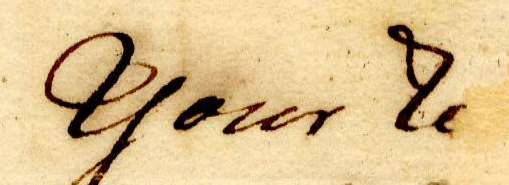Your le
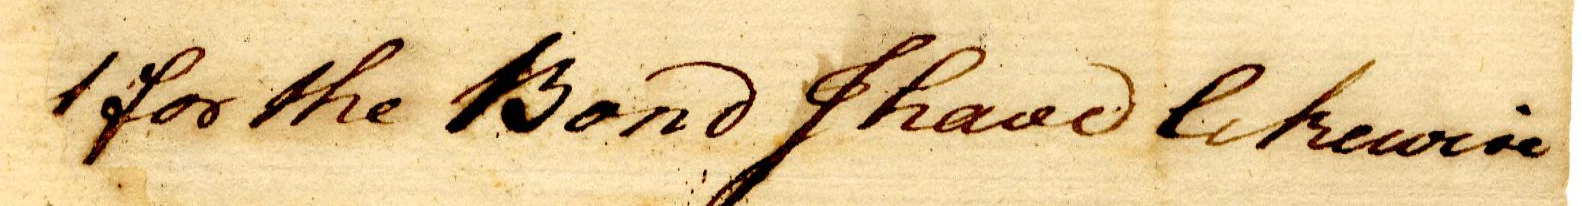1 for the Bond I have likewise
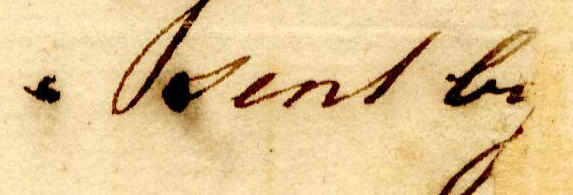sent by
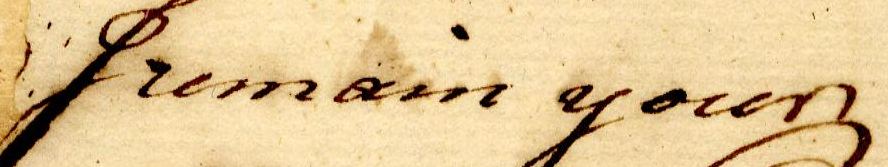l remain your
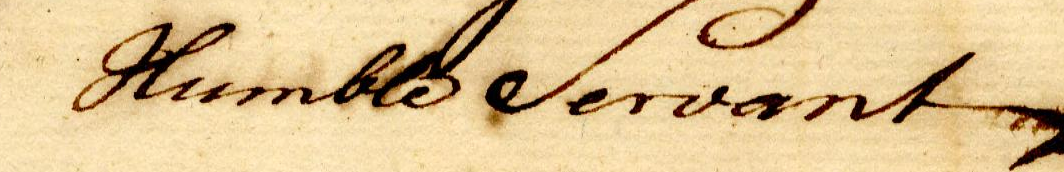Humble Servant
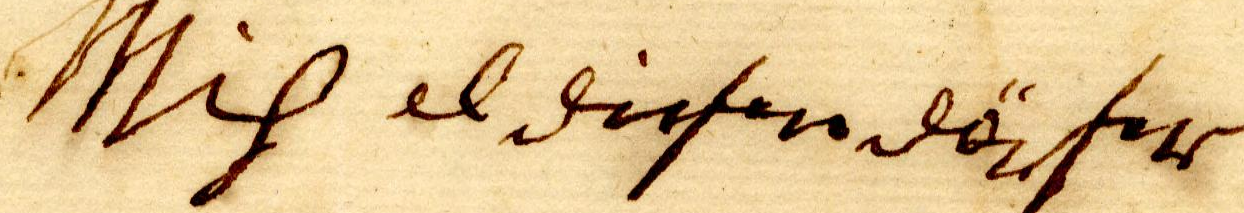Michael Diffendörfer
